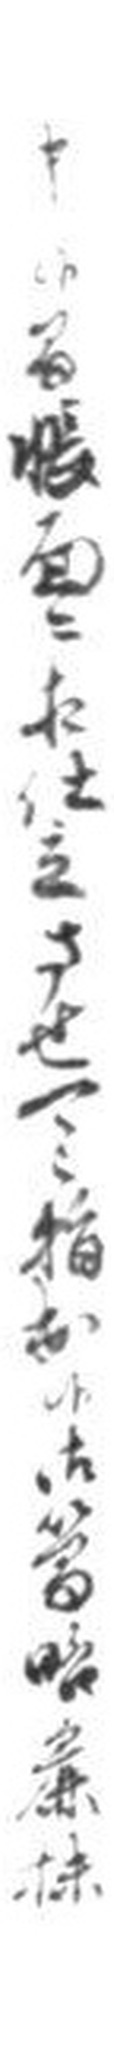申候間帳面ニ相仕立させ可被指出候御簡略麁抹
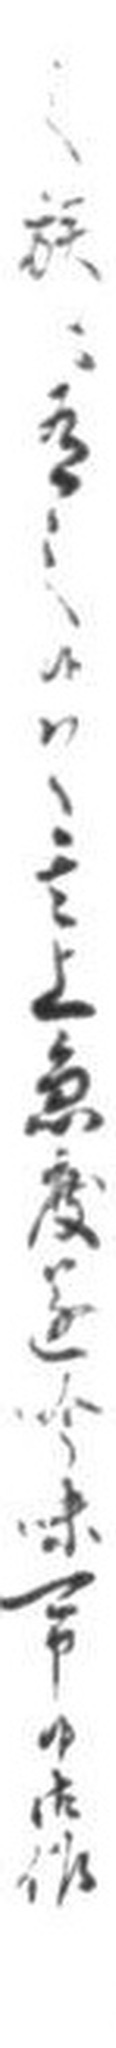之族ニ有之候ハゝ其上急度遂吟味可申候御作
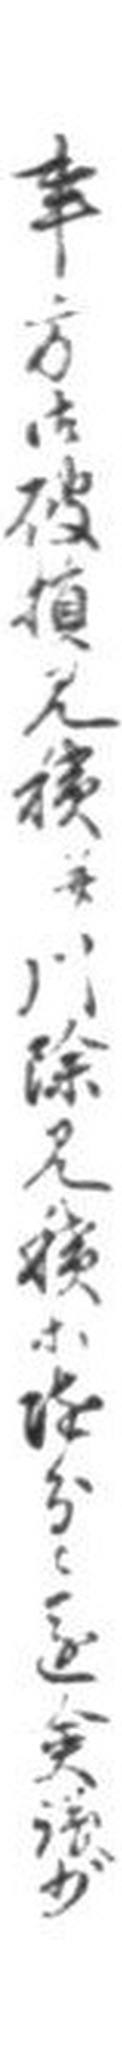事方御破損見積幷川除見積等随分被遂僉議少
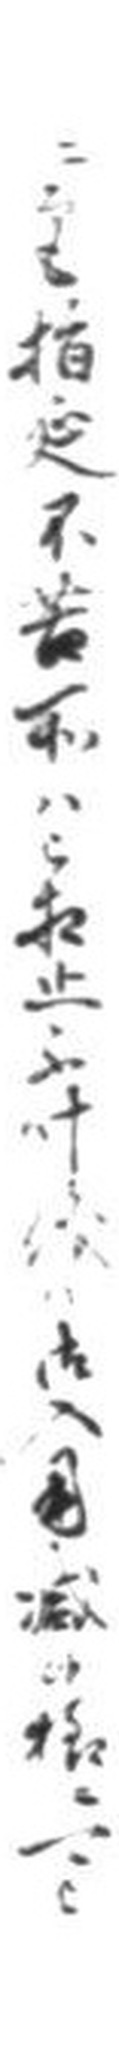ニ而も指延不苦所は被相止不叶儀は御入用減候様ニ可被
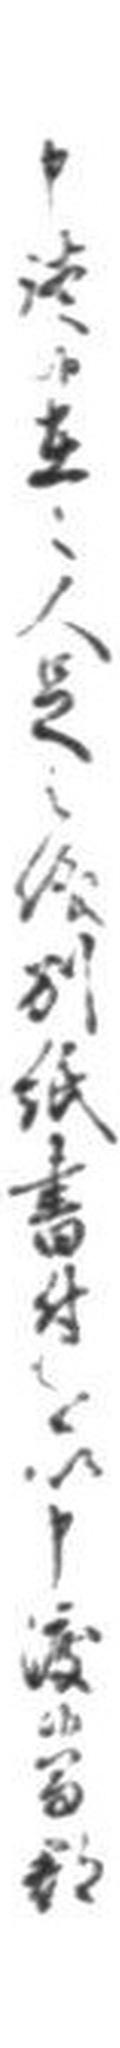申談候在々人足之儀別紙書付を以申渡候間郡
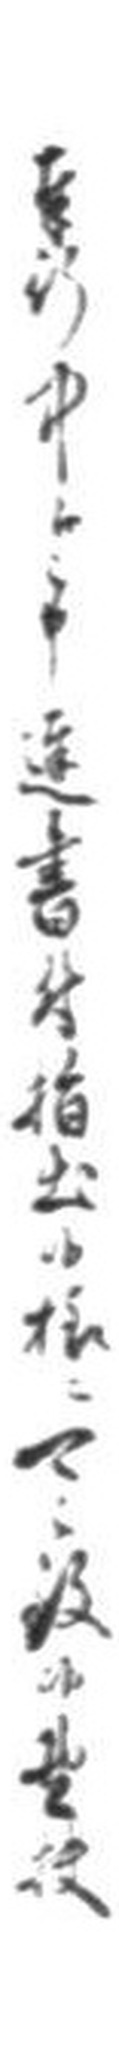奉行中江被申達書付指出候様ニ可被致候野扶
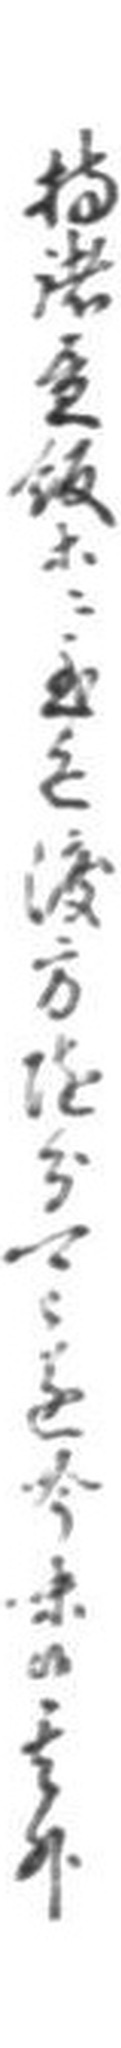持諸昼飯等ニ至迄渡方随分可被遂吟味候其外
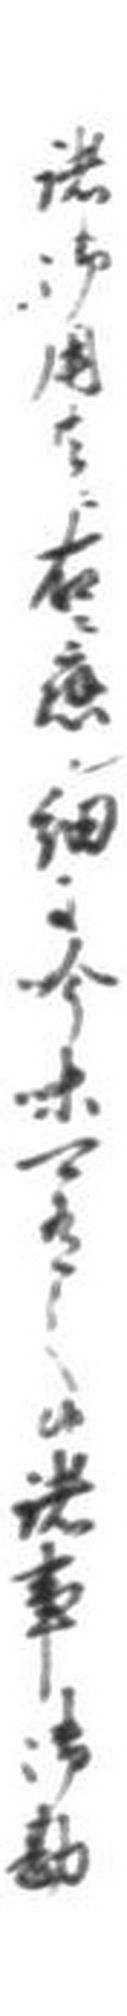諸御用共ニ右ニ応シ細に吟味可有之候諸事御勘
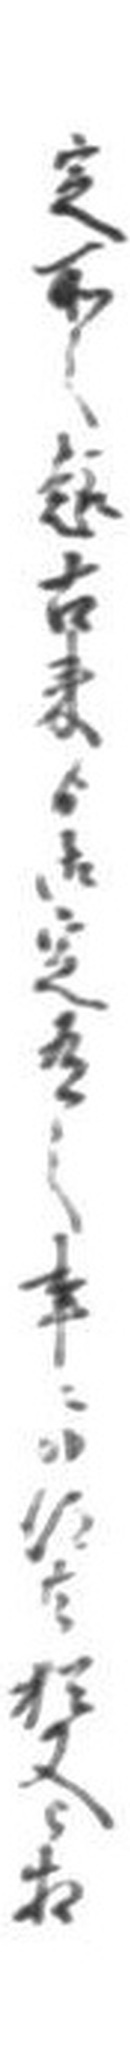定所之趣古来ゟ御定有之事ニ候得共猶又被相
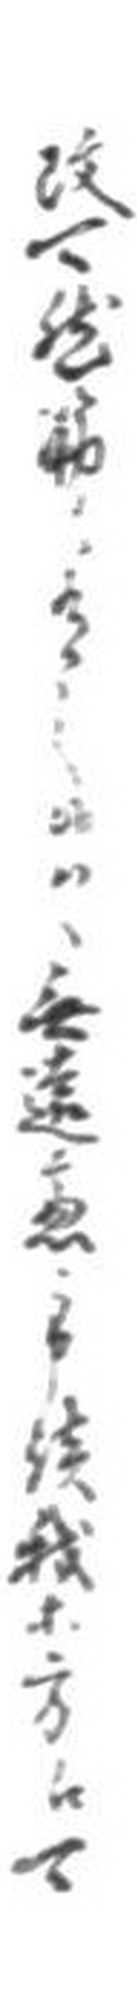改可然筋も有之候ハゝ無遠慮ニ申談我等方江可
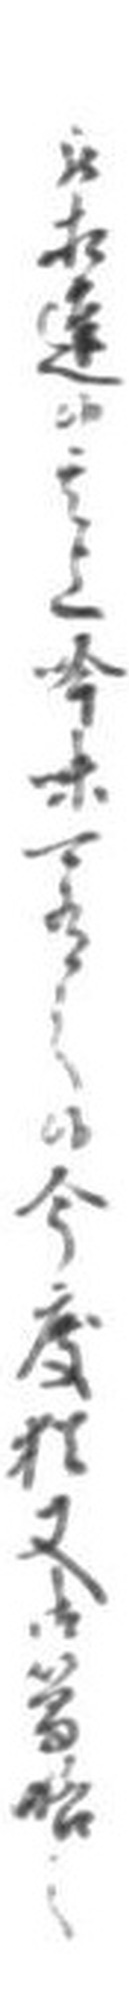被相達候其上吟味可有之候今度猶又御簡略之
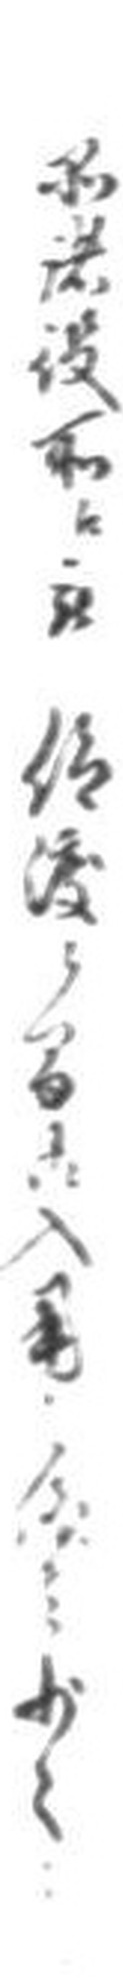品諸役所江被仰渡候間御入用之儀は少々
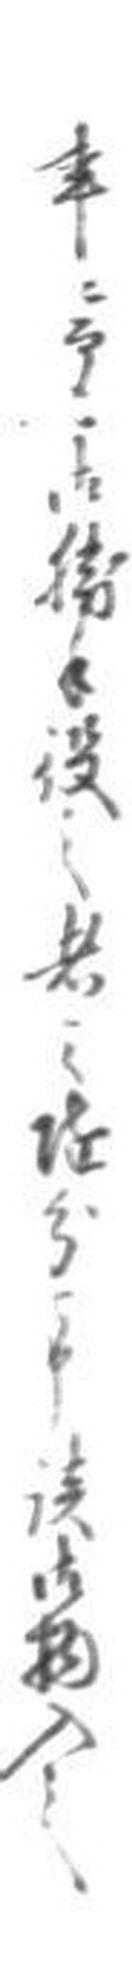事ニ而も御勝手役之者之随分被申談御物入之
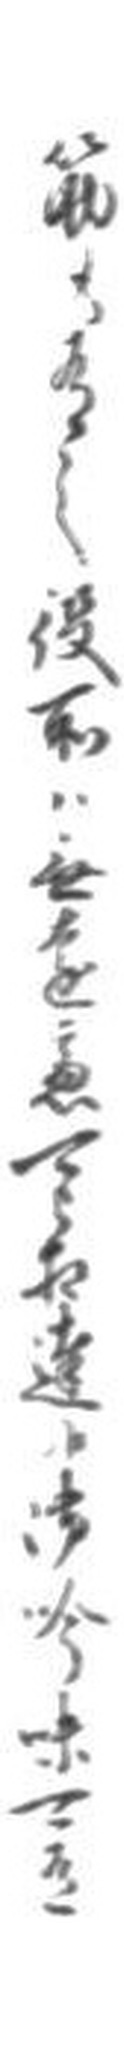筋も有之役所ハ無遠慮可被相達候御吟味可有
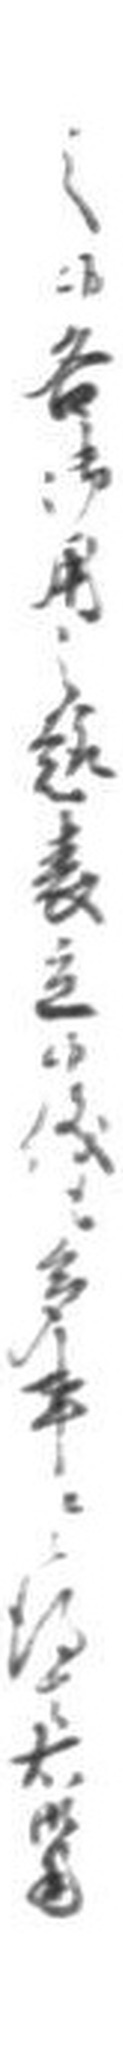之候各御用之趣表立候儀も多事ニ候得者右御用

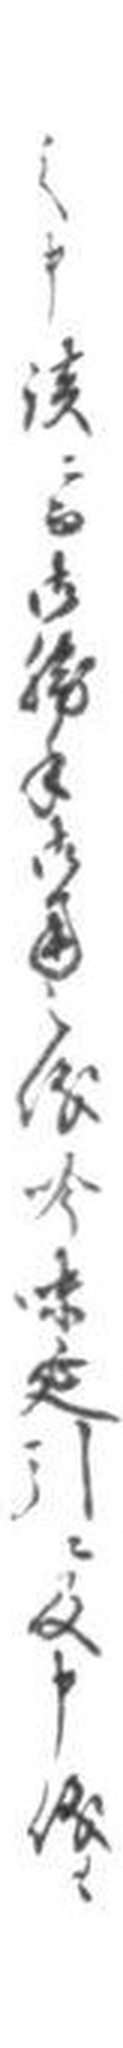之申談ニ而御勝手御用之儀吟味延引ニ及申儀も
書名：家譜 三十九 宗矩公 享保十年
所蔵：福井県文書館 Fukui Prefectural Archives
